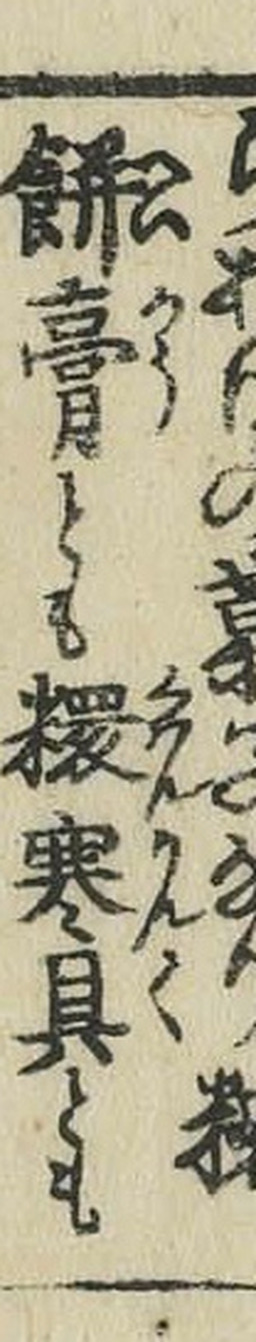餅膏とも糫寒具とも
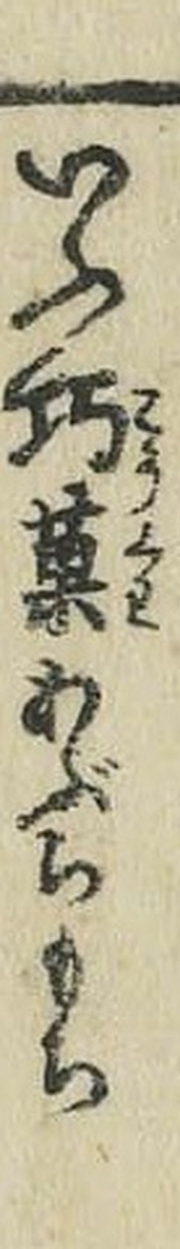いふ巧菓あぶらもち
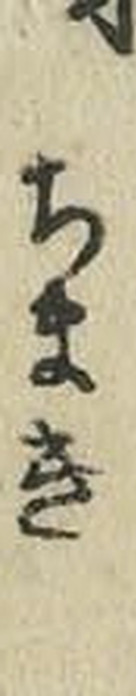ちまき

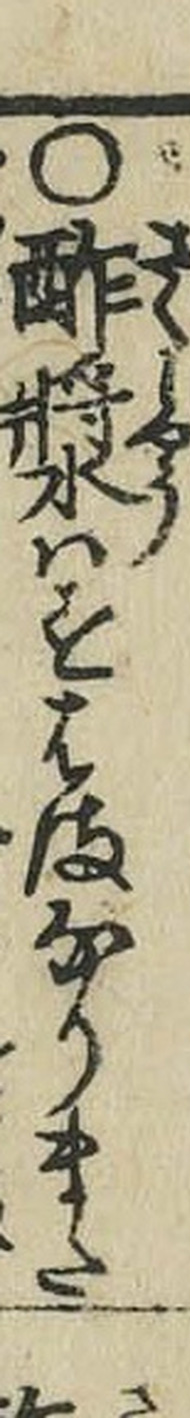○酢漿はすはまなりまた
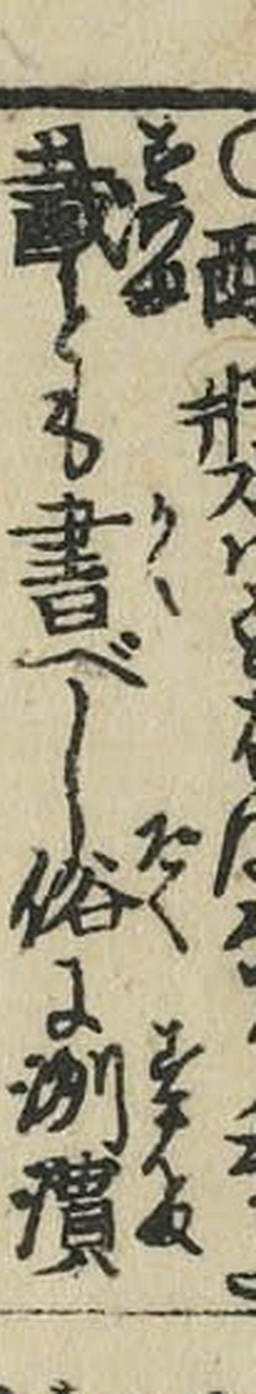酨とも書べし俗に洲浜
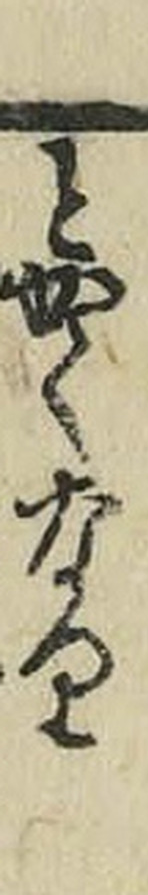とかくなり
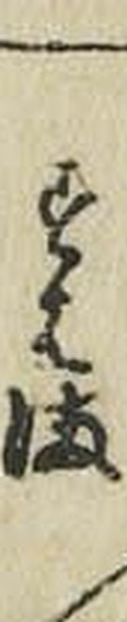すはま
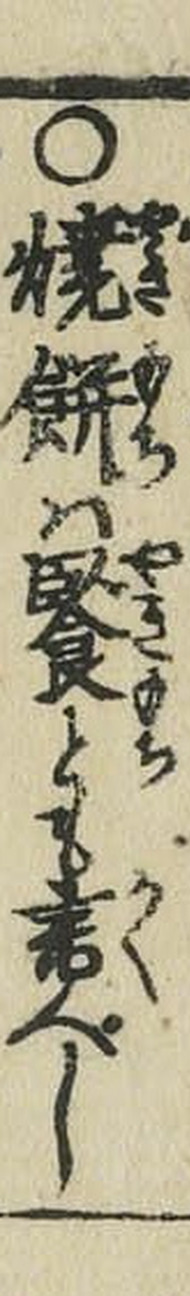○焼餅は䭆とも書べし
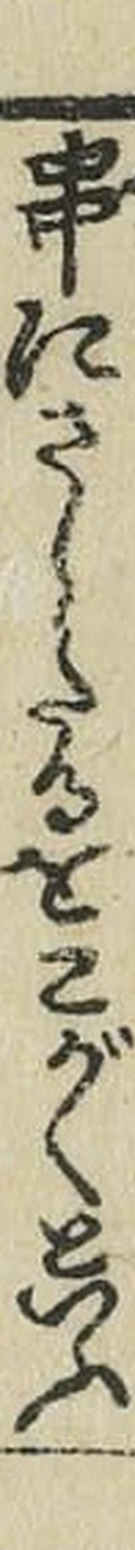串にさしたるをこがゝといふ
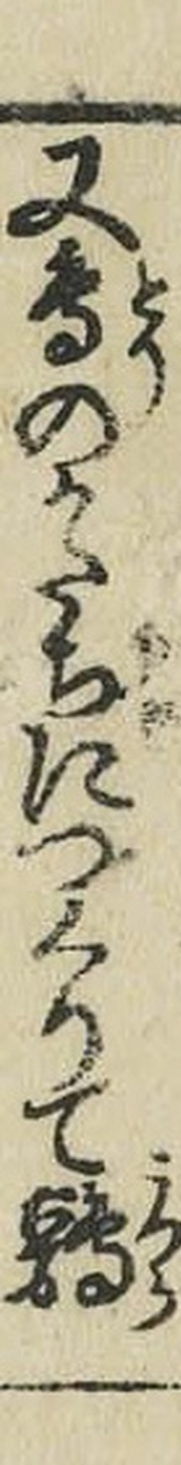又鳥のかたちにつくりて鶉
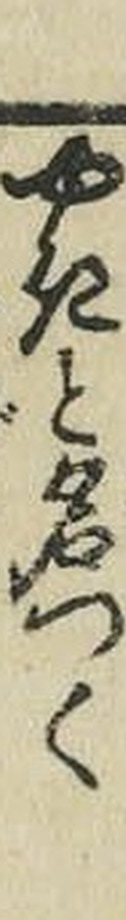やきと名づく
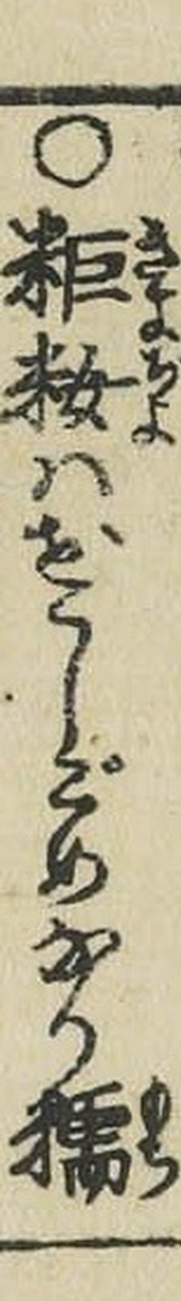○粔籹はをこしごめなり糯
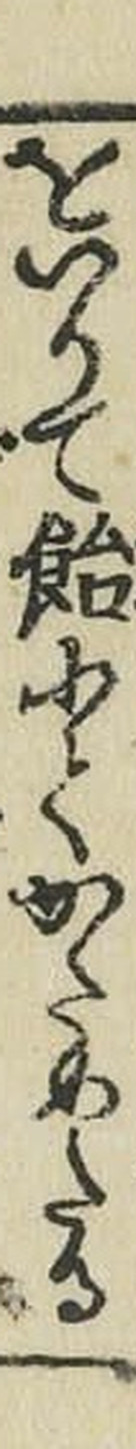をいりて飴にてかためたる
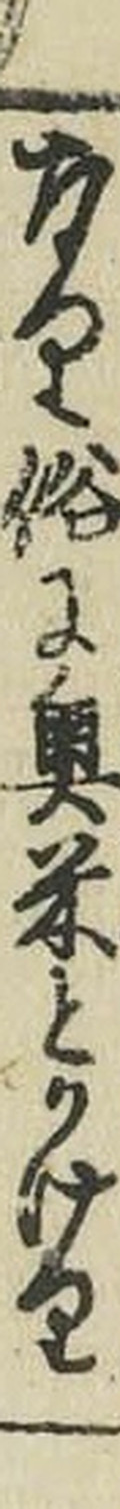なり俗に奥米とかけり
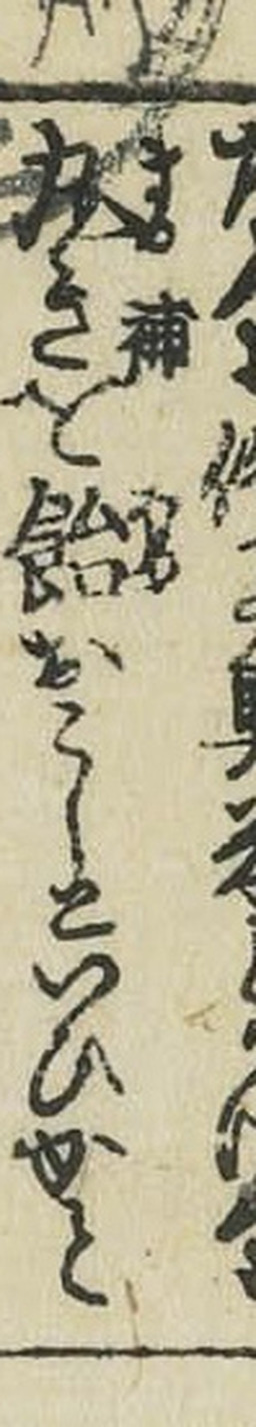丸き補を飴おこしといひかと
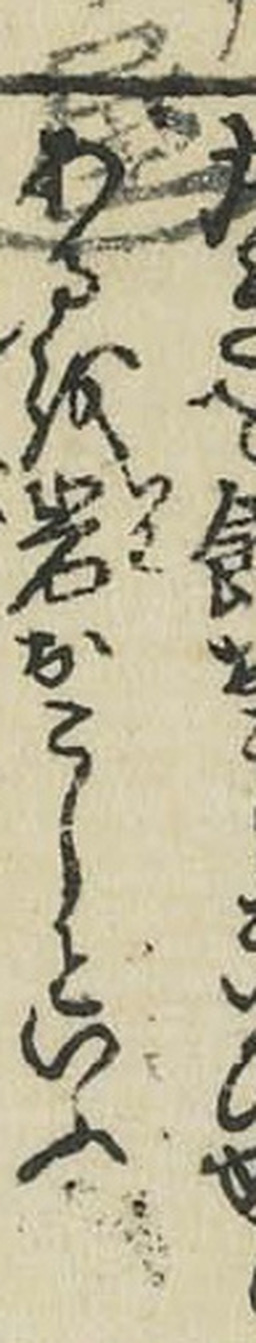あるを岩おこしといふ
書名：増補頭書訓蒙図彙大成 10巻 7:巻之14-16
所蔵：東京学芸大学教育コンテンツアーカイブ
